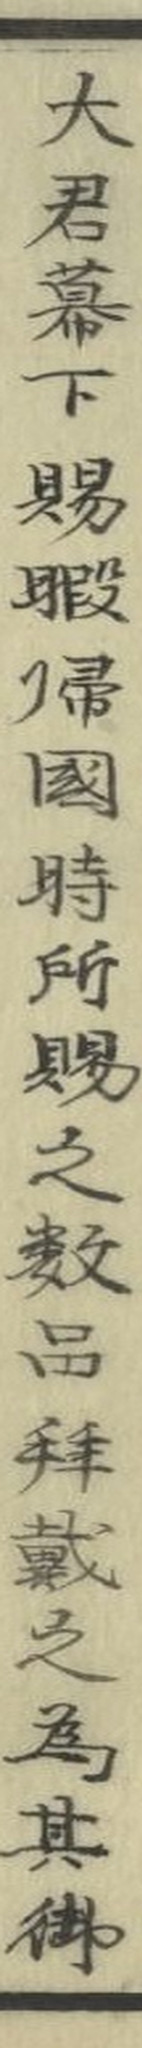大君幕下賜暇帰国時所賜之数品拝載之為其御
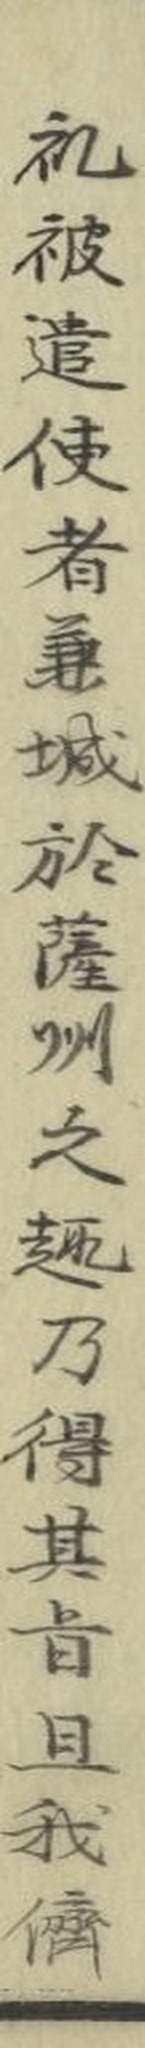礼被遣使者兼城於薩州之趣及得其旨且我儕
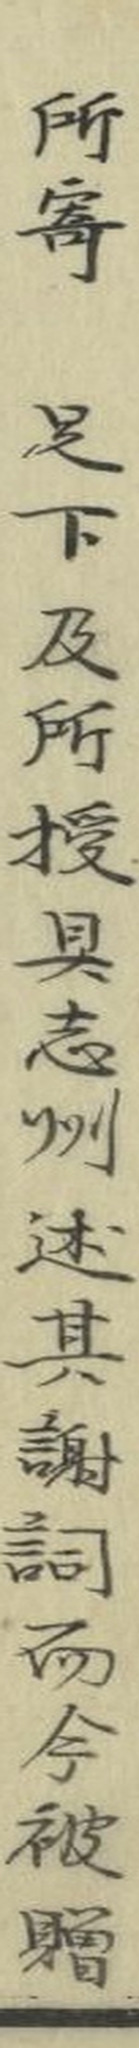所寄足下及所援具志州述其謝詞而今被贈
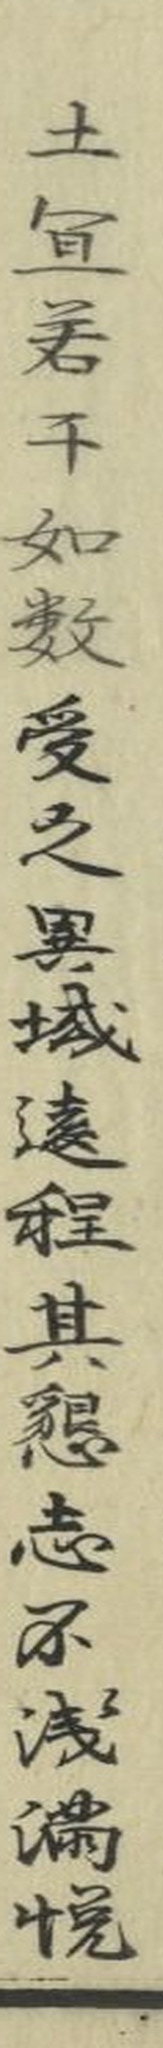土冝若干如数受之異城遠程其懇志不浅満悦
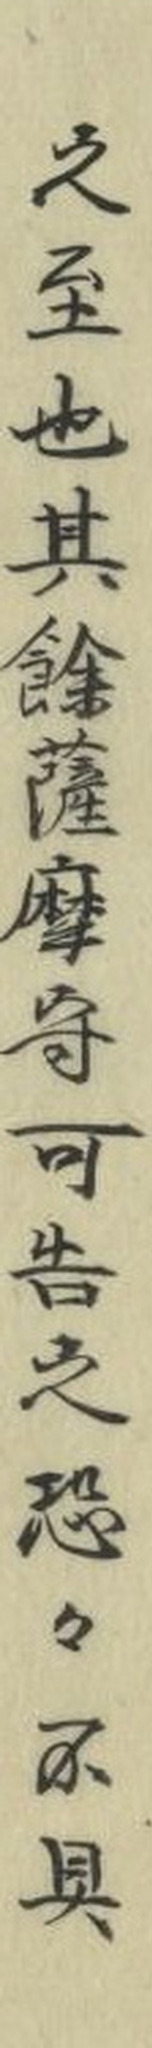之至也其余薩摩守可告之恐々不具
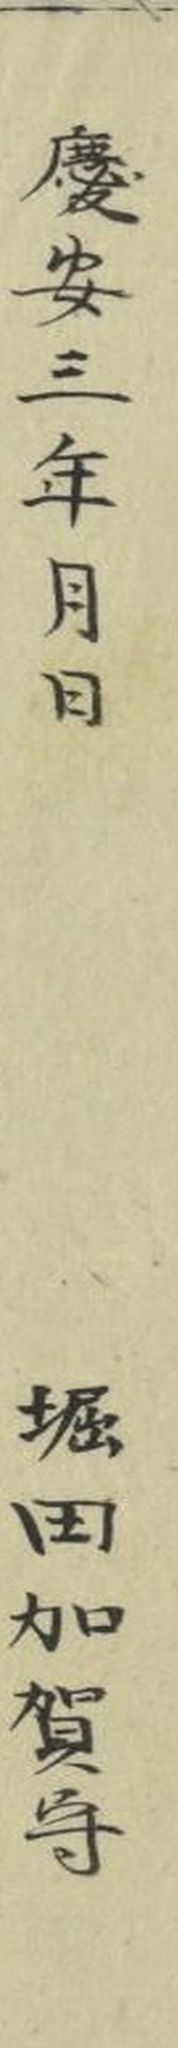慶安三年月日堀田加賀守
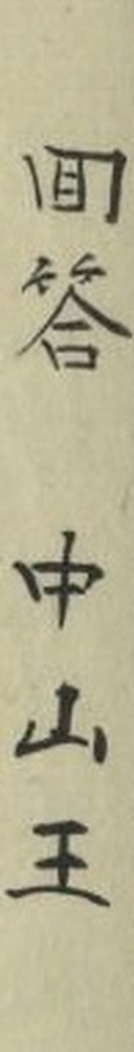回答中山王
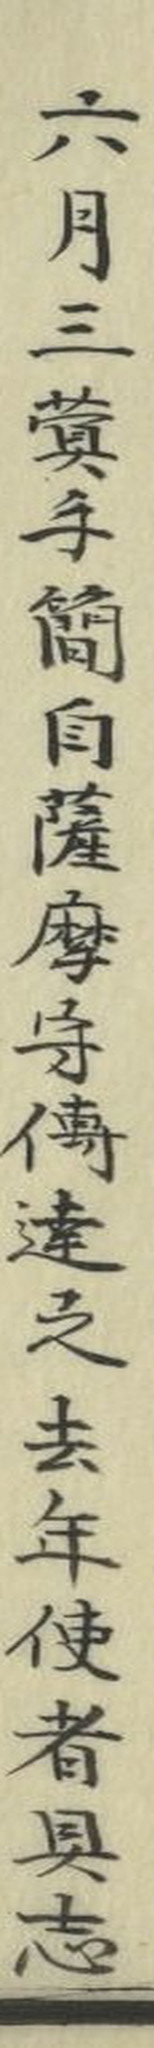六月三蓂手簡自薩摩守伝達之去年使者具志
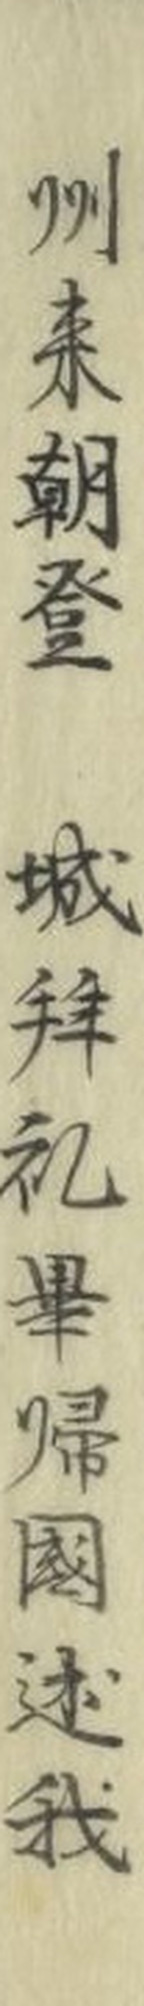州来朝登城拝礼畢帰国述我
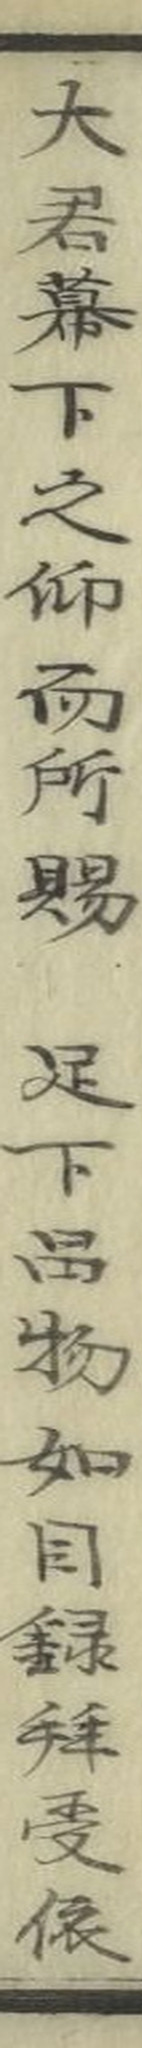大君幕下之仰而所賜足下品物如目録拝受依
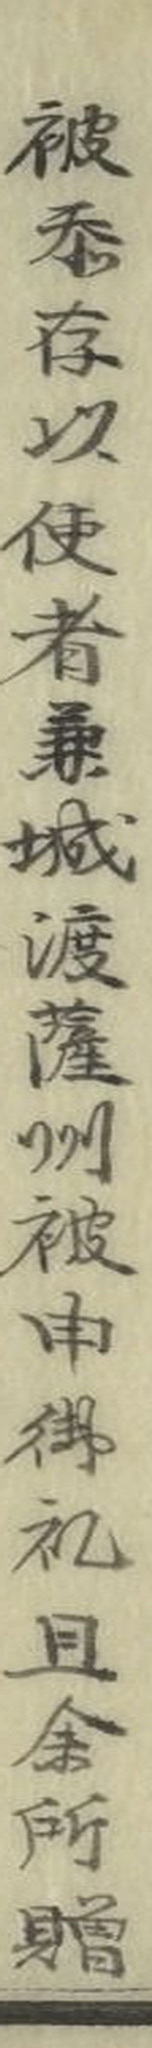被忝存以使者兼城渡薩州被申御礼且余所贈
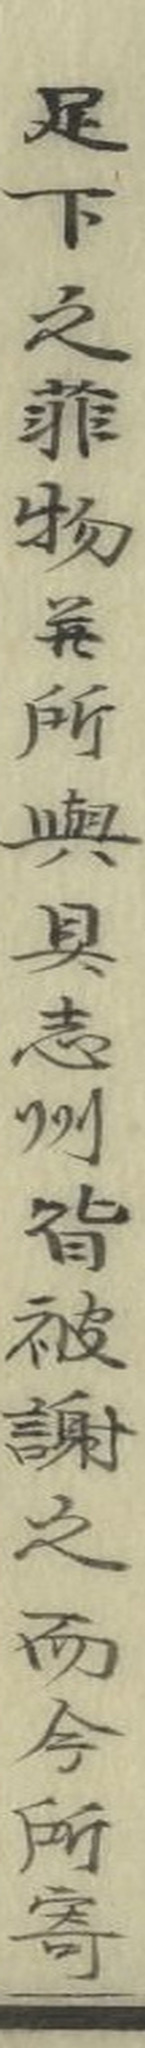足下之菲物幷所与具志州皆被謝之而今所寄
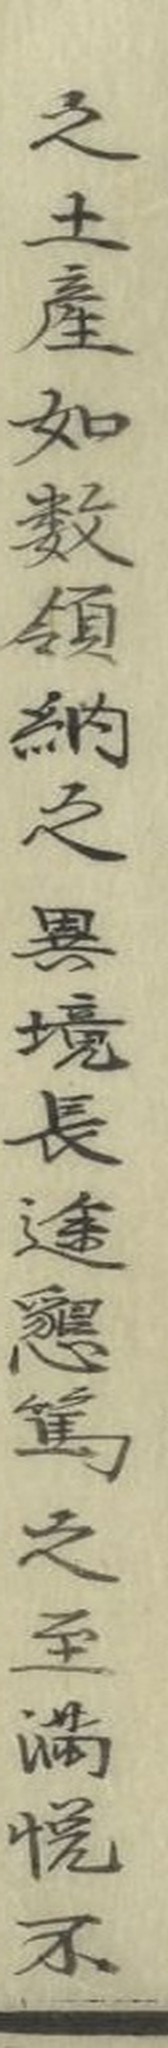之土産如数領納之異境長途懇篤之至満悦不
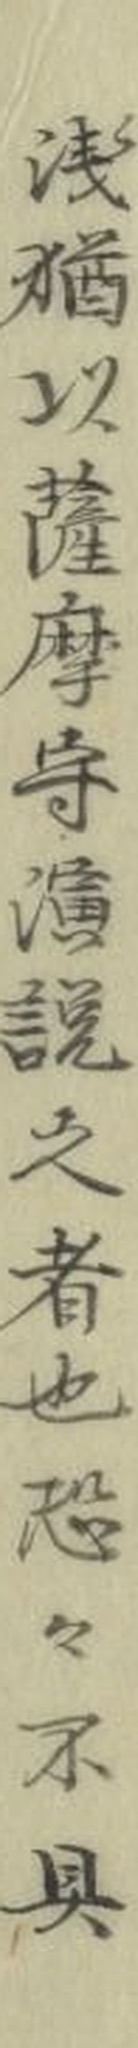浅猶以薩摩守演説之者也恐々不具

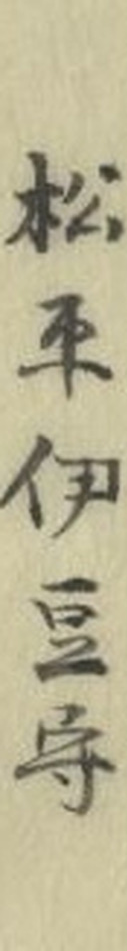松平伊豆守
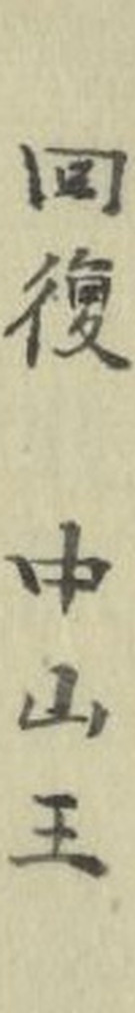回復中山王
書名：琉球往来（上）
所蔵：University of the Ryukyus Library
